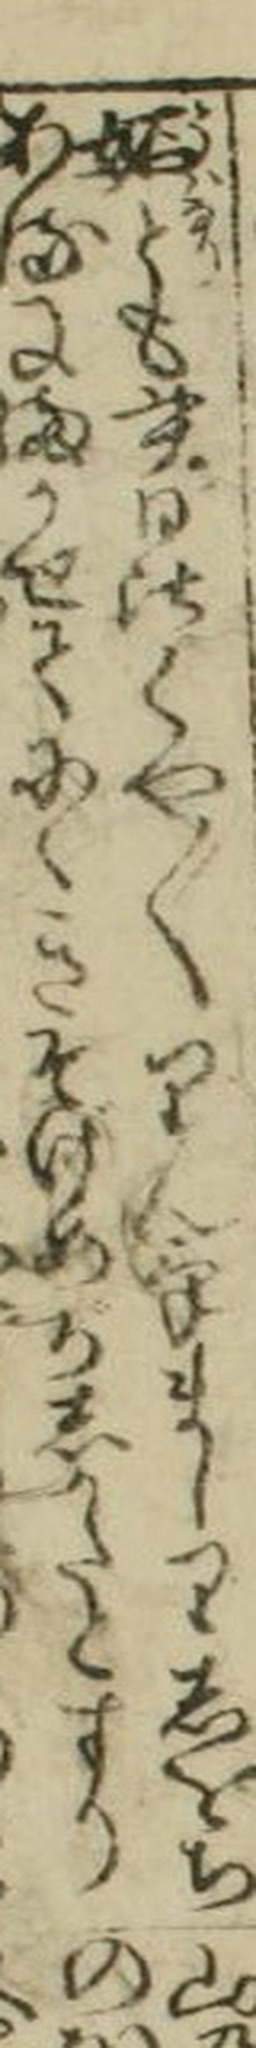あるにまかせてにくきそげめがしかたとすり
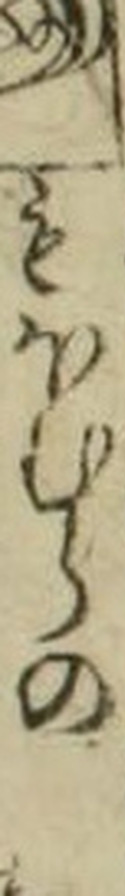もほむらの
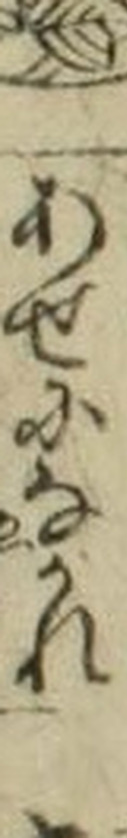あせにながれ
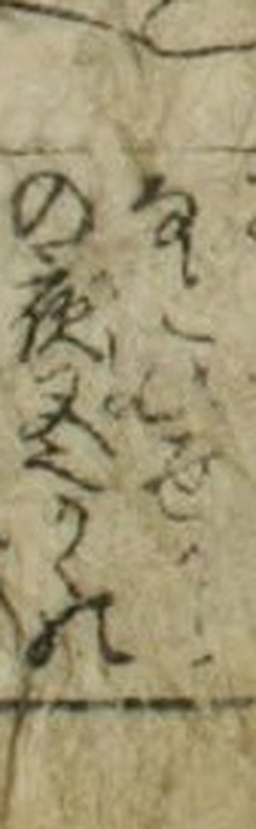の夜叉かくの
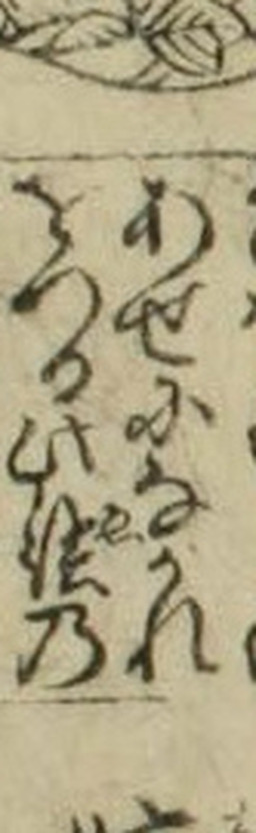をつる此繪の
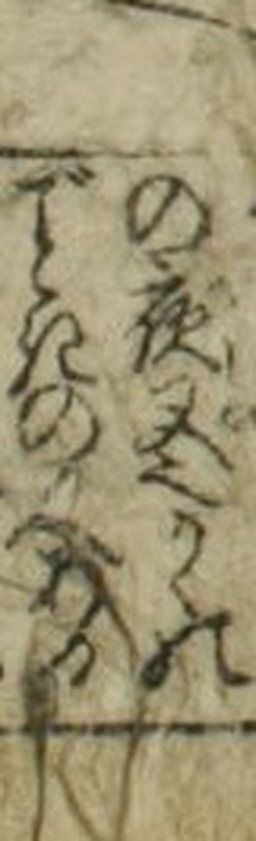ごときの人ある
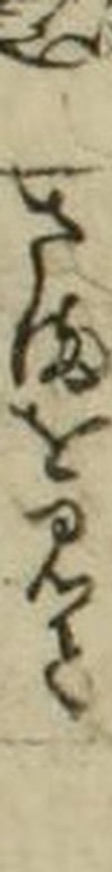さまを見て
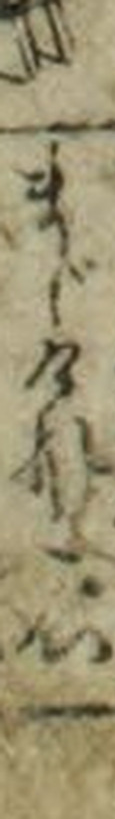まじけれと心
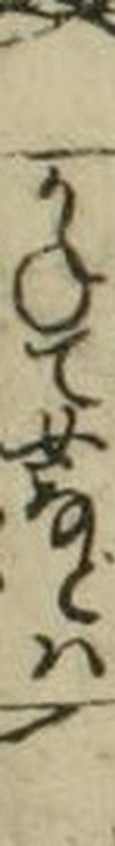かねて女などは
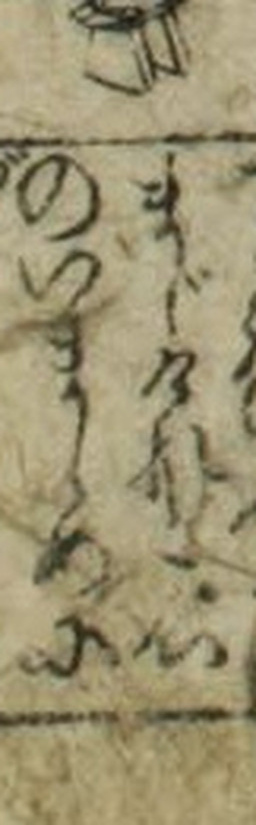のいましめに
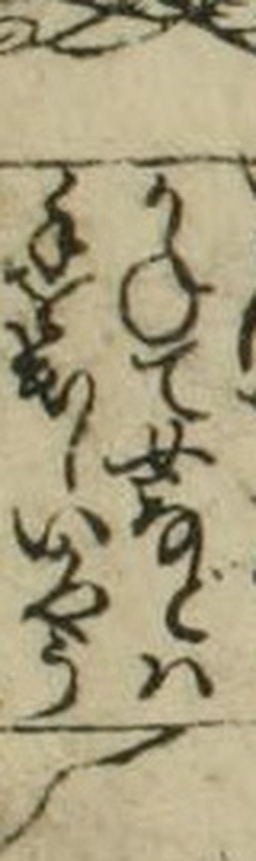手を出しいかやう
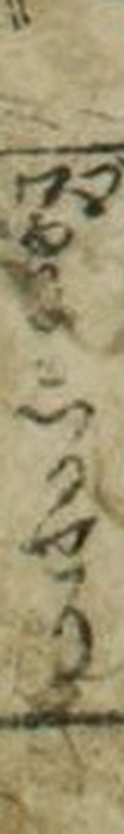図にしるせり
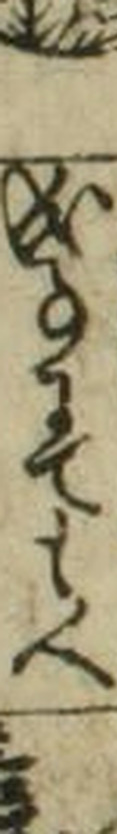成事にても人
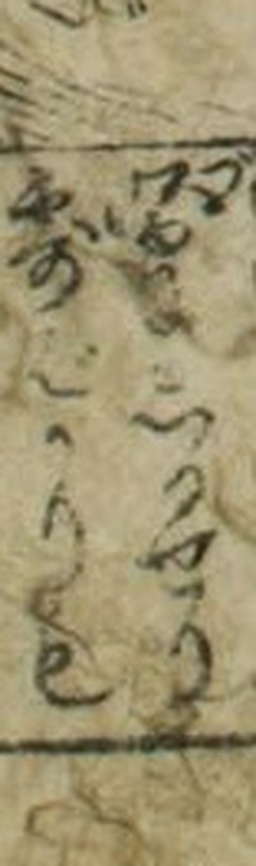露ばかりも
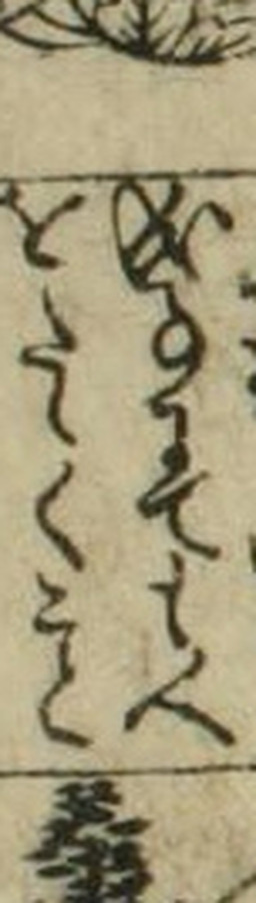をたゝくこと
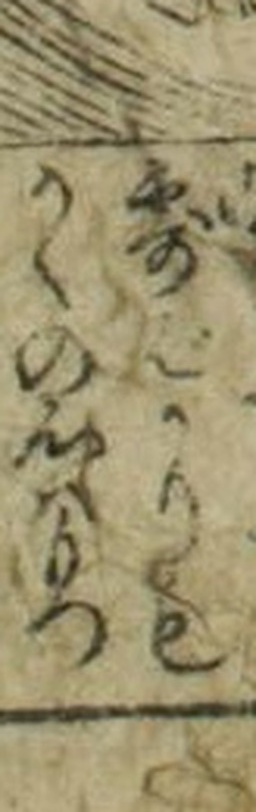かくの心はもつ
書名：女源氏教訓鑑
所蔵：東京学芸大学附属図書館
